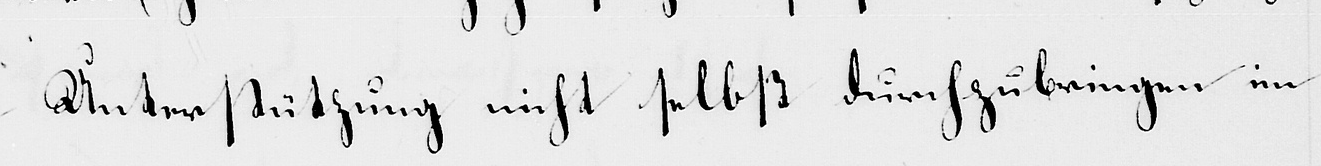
Unterstützung nicht selbst durchzubringen im
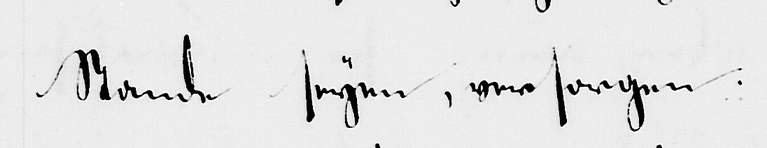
Stande seyen, versorgen:
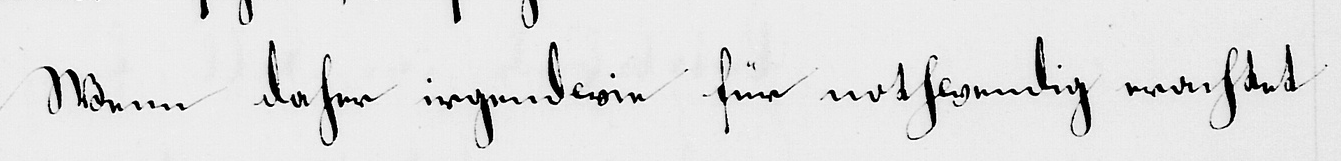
Wenn daher irgendwie für nothwendig erachtet
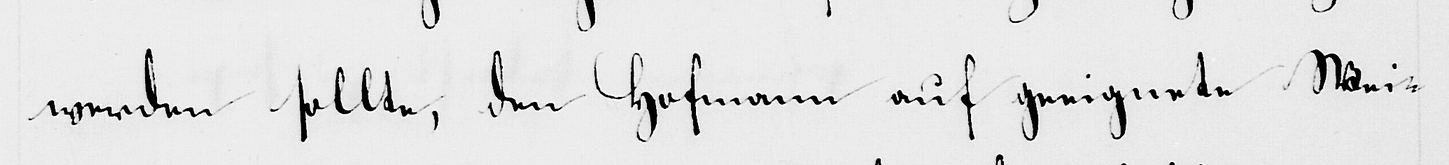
werden sollte, den Hofmann auf geeignete Wei¬
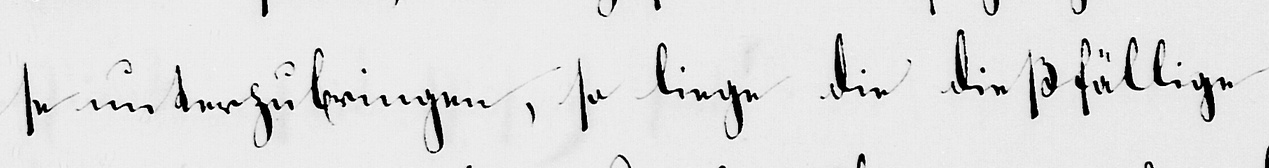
se unterzubringen, so liege die dießfällige
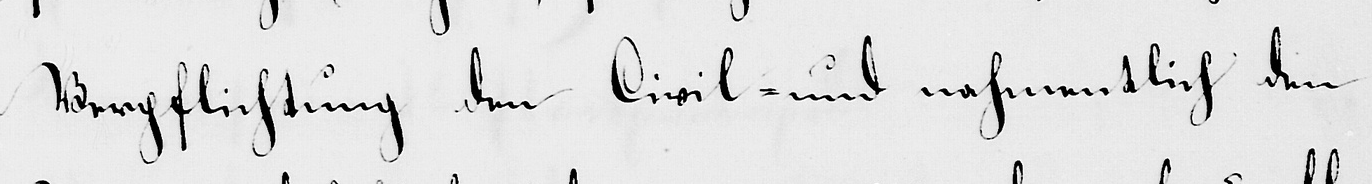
Verpflichtung den Civil- und nahmentlich den
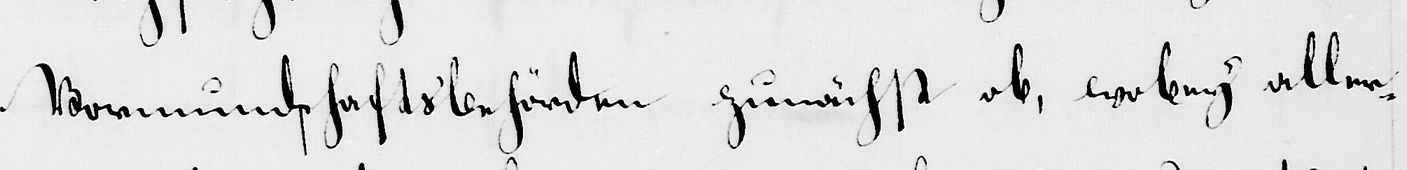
Vormundschaftsbehörden zunächst ob, wobey aller¬
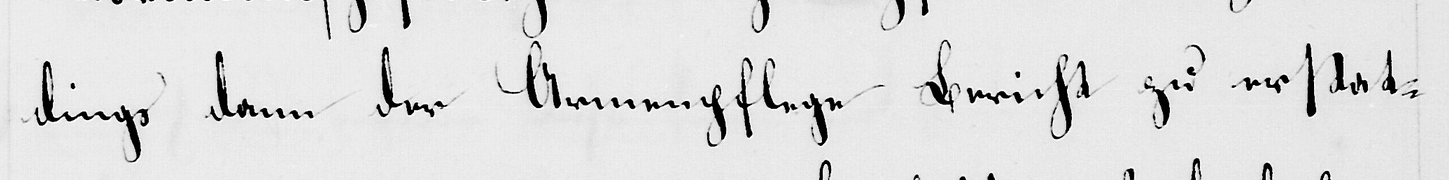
dings dann der Armenpflege Bericht zu erstat¬
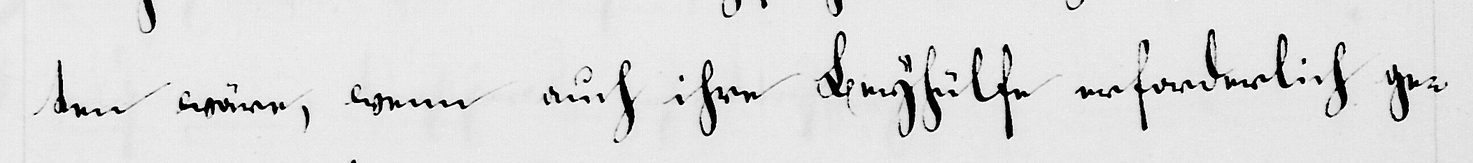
ten wäre, wenn auch ihre Beyhülfe erforderlich ge¬
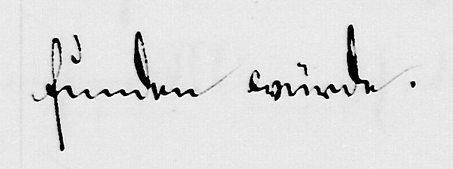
funden würde.
